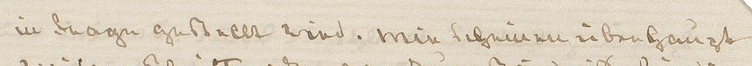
in Frage gestellt wird. Mir scheinen überhaupt
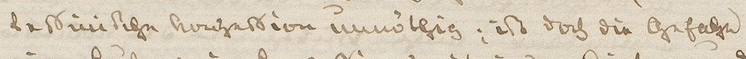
tessinische Konzession unnöthig; ist doch die Gefahr
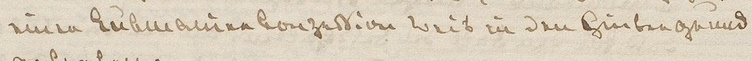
einer Lukmanierkonzession weit in den Hintergrund
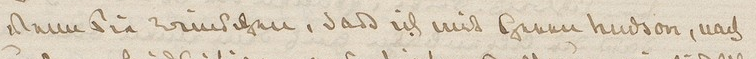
Wenn Sie wünschen, daß ich mit Herrn Hudson, nach
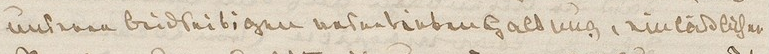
unserer beidseitigen reservirten Haltung, einläßlicher
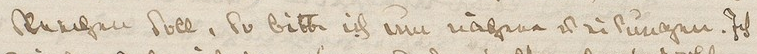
sprechen soll, so bitte ich um nähere Weisungen. Ich
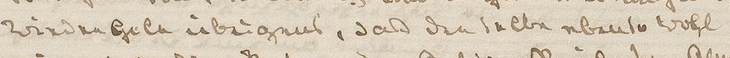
wiederhole übrigens, daß derselbe ebenso wohl
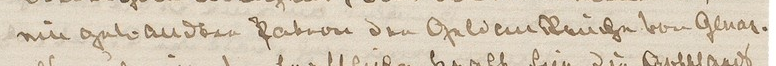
ein gewandter Patron der Geldansprüche von Genaz.,
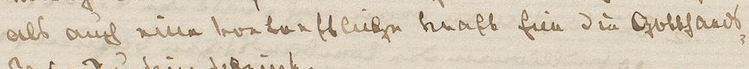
als auch eine vortreffliche Kraft für die Gotthard-
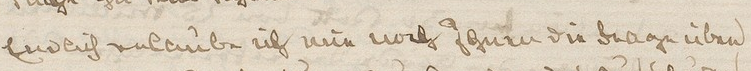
Endlich erlaube ich mir noch Ihnen die Frage über
